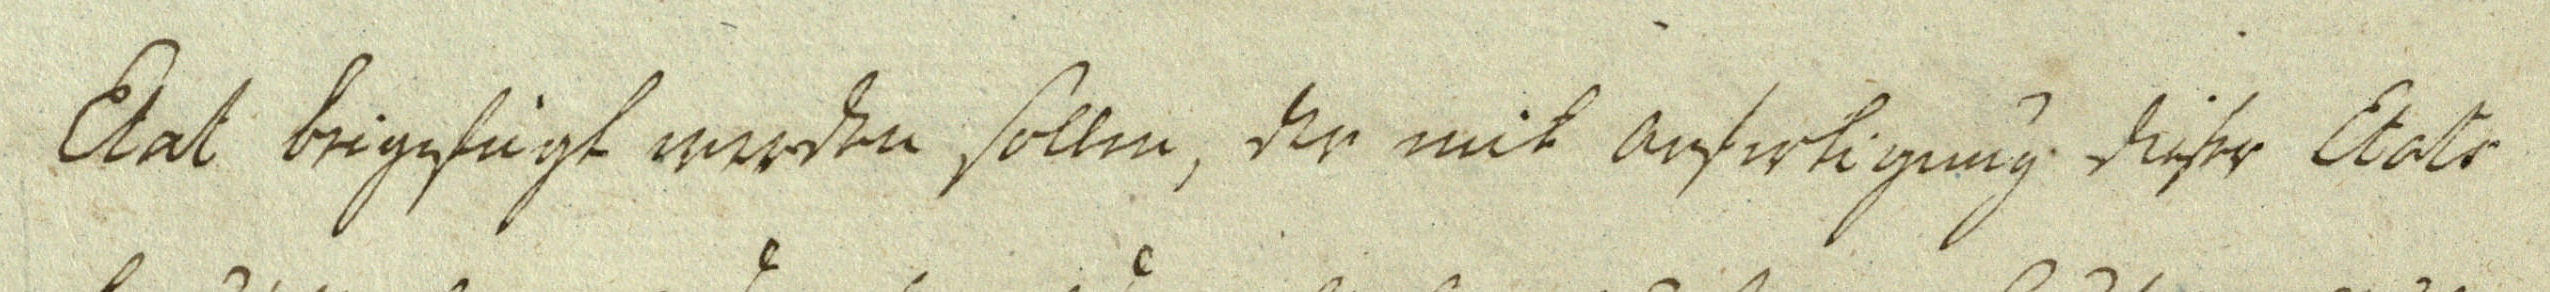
Etat beigefügt werden sollen, der mit Anfertigung dieser Etate
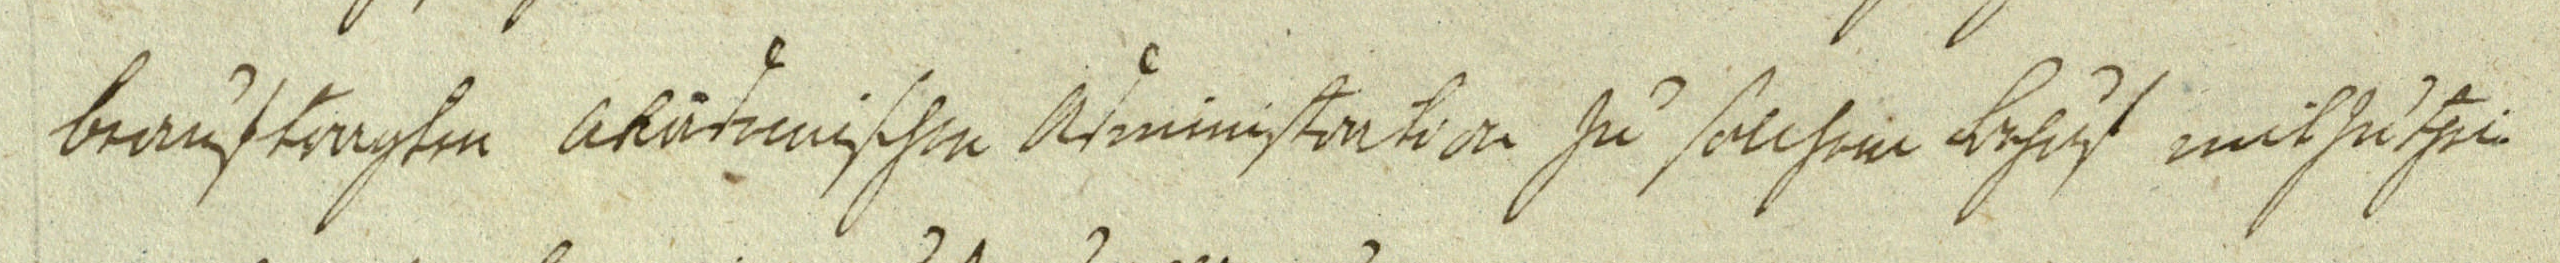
beauftragten Akademischen Administration zu solchem Behuf mitzuthei¬
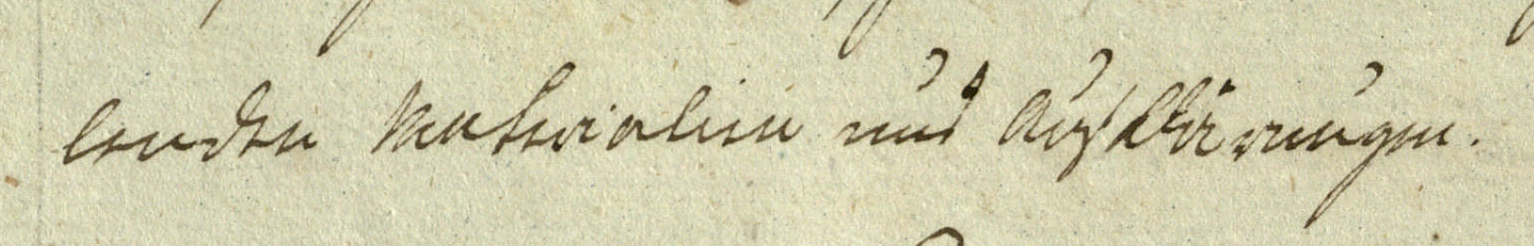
lenden Materialien und Aufklärungen.
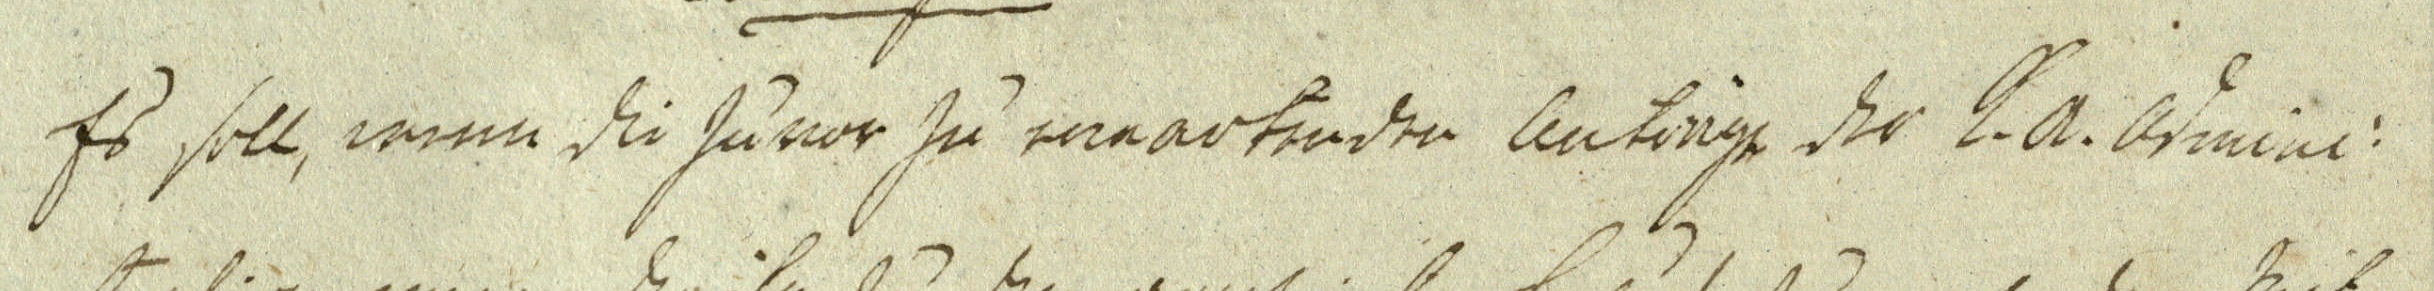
Es soll, wenn die zuvor zu erwartenden Anträge der K. A. Admini¬
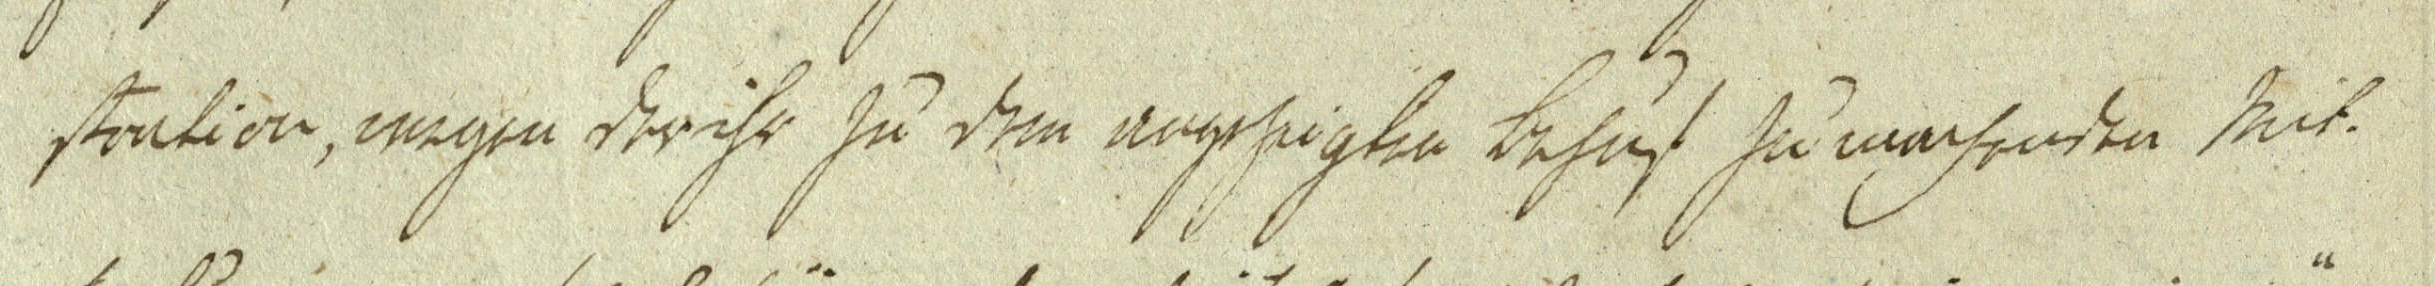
stration, wegen der ihr zu dem angezeigten Behuf zu machenden Mit¬
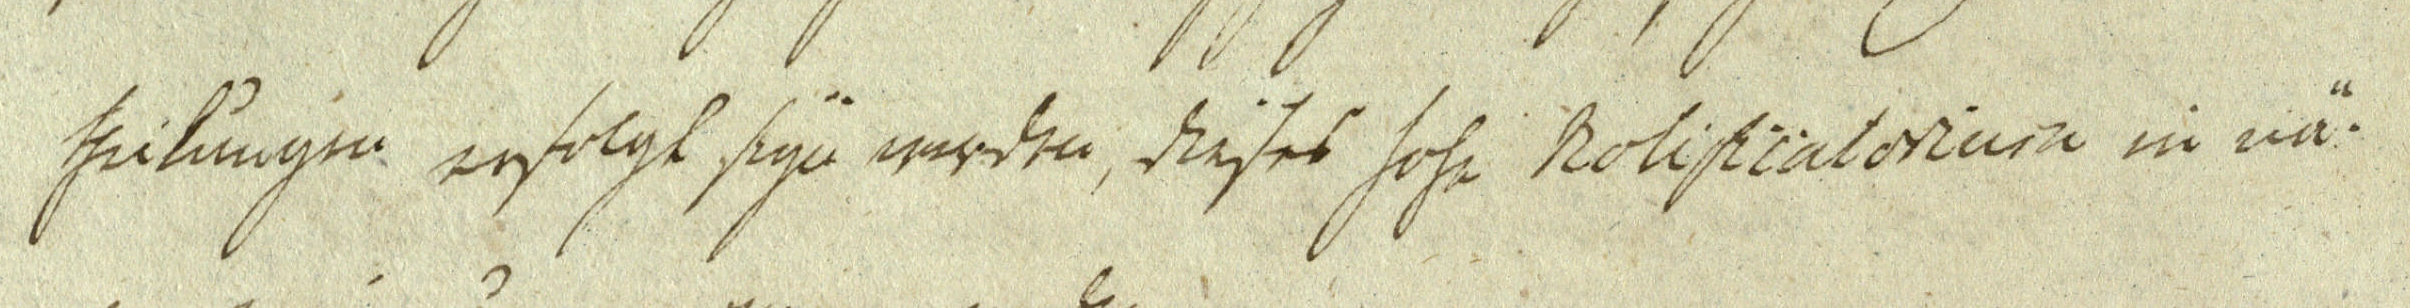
theilungen erfolgt seÿn werden, dieses hohe Notificatorium in nä¬
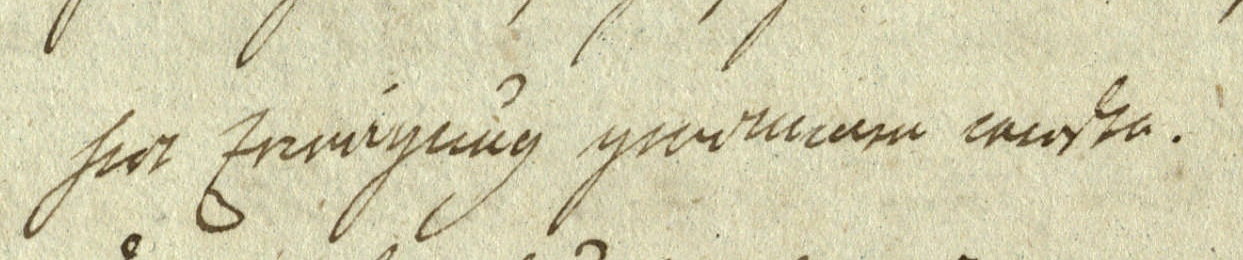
here Erwägung genommen werden.
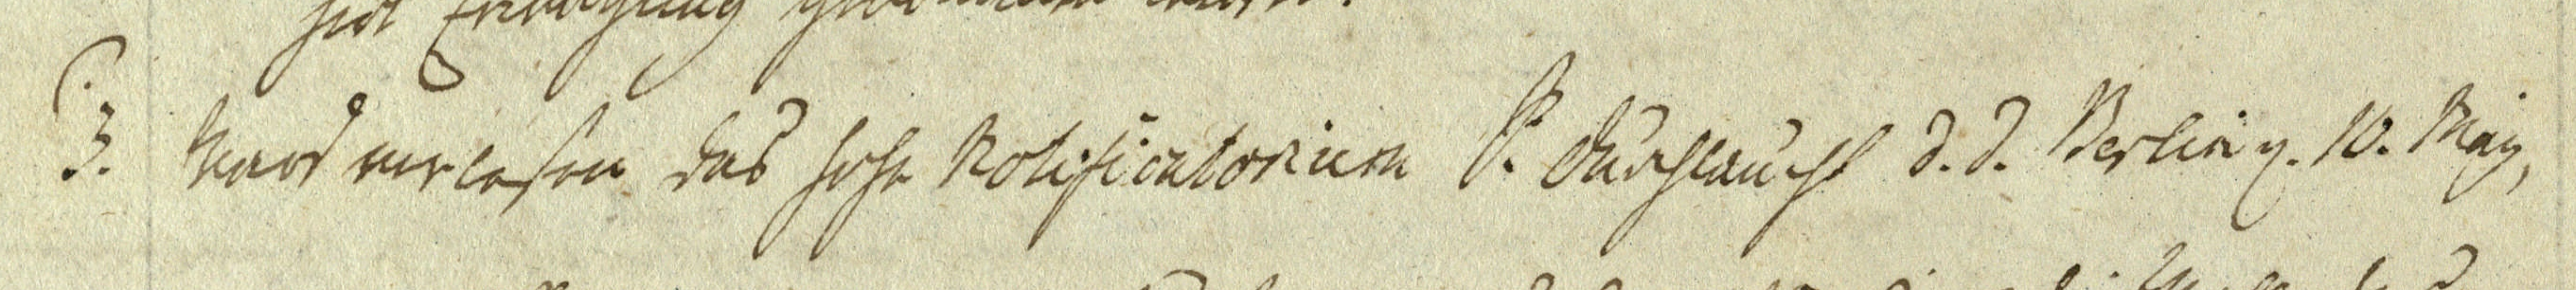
3. Ward verlesen es hohe Notificatorium Sr. Durchlaucht d. d. Berlin, 12 Maÿ,
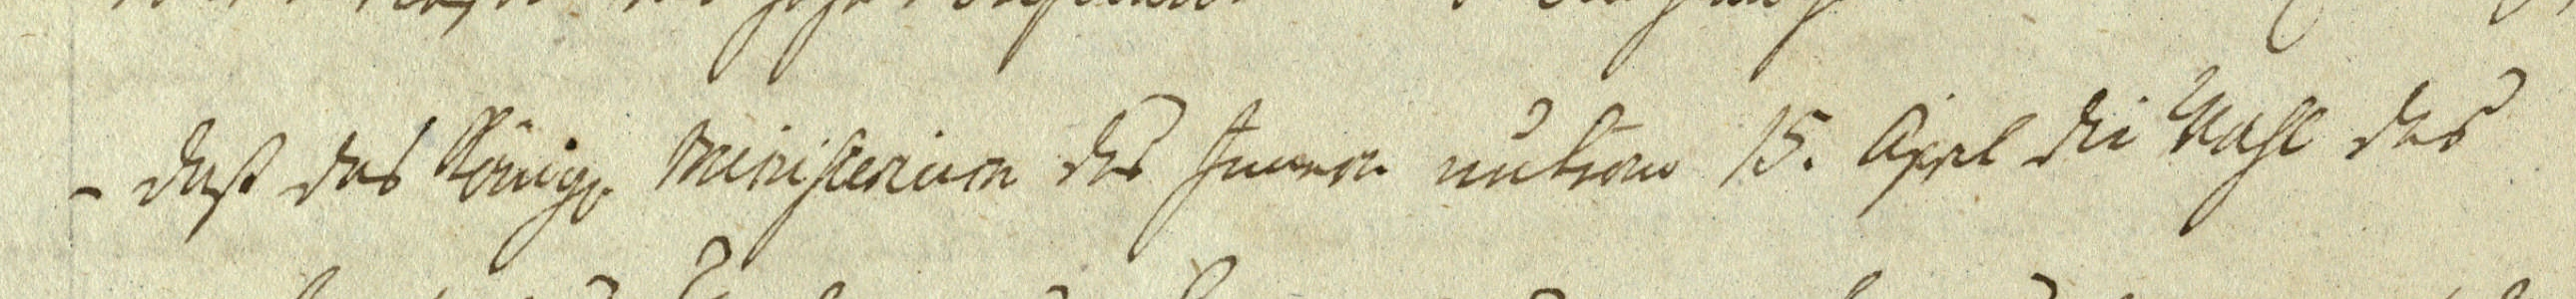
daß des Königl. Ministrum des nur unterm 1. April die Wahl des
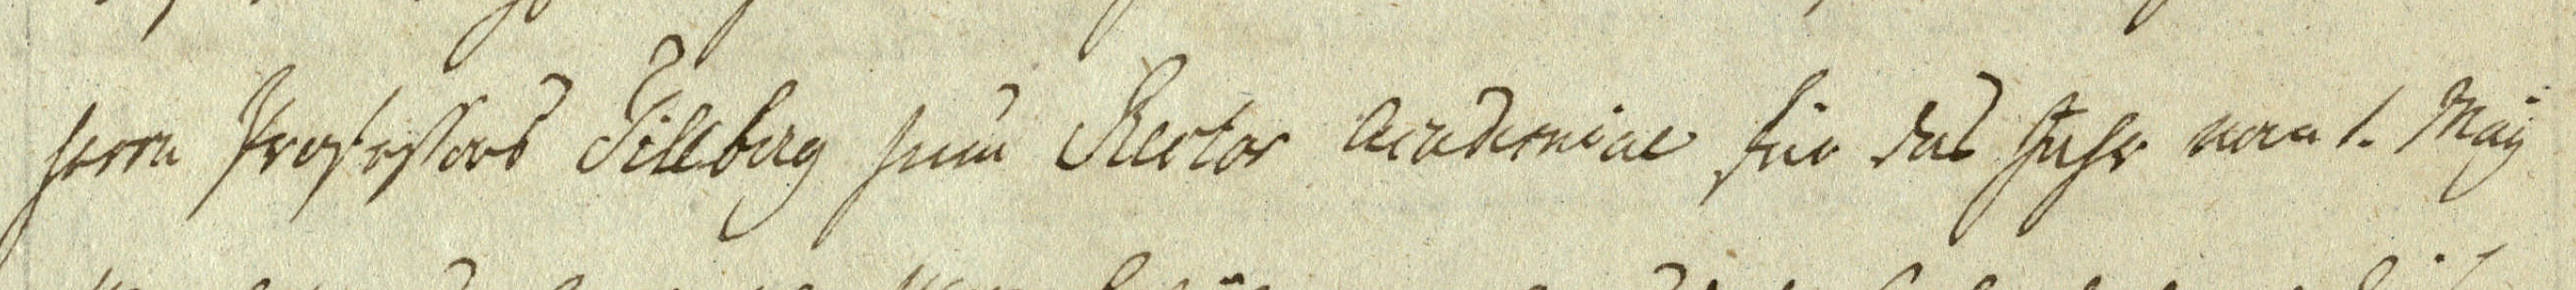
dem Professors Tillberg zum Rector Academie für das Jahr v. 1. Maÿ
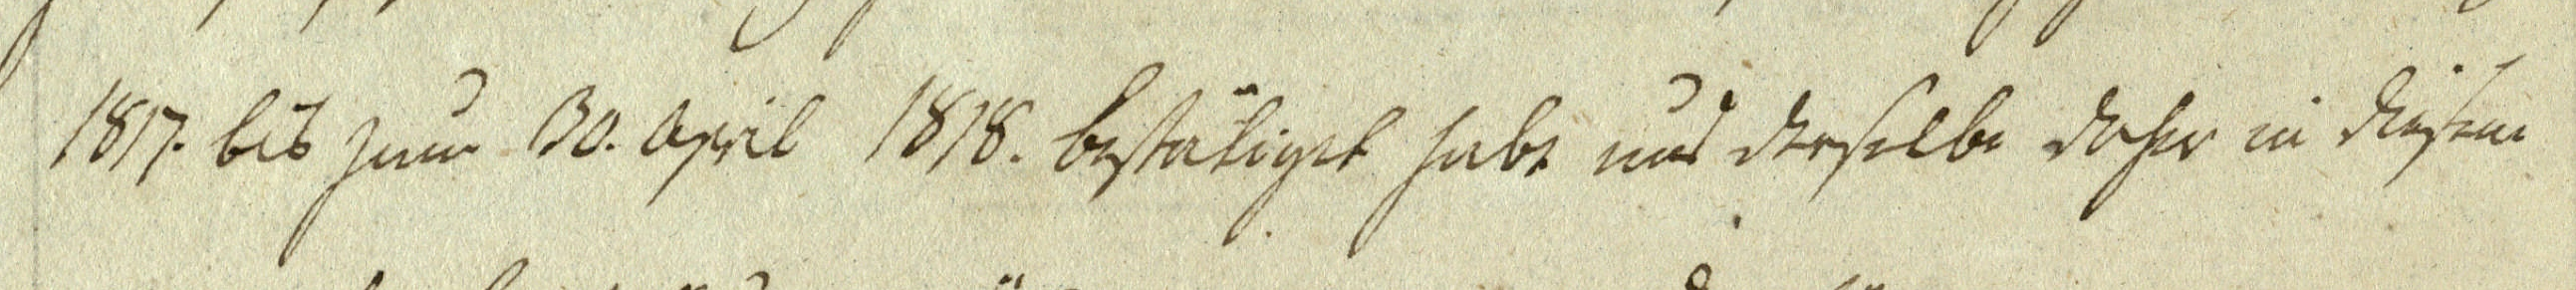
1817 bis zum 30. April 1818. bestätiget habe und derselbe daher in diesem
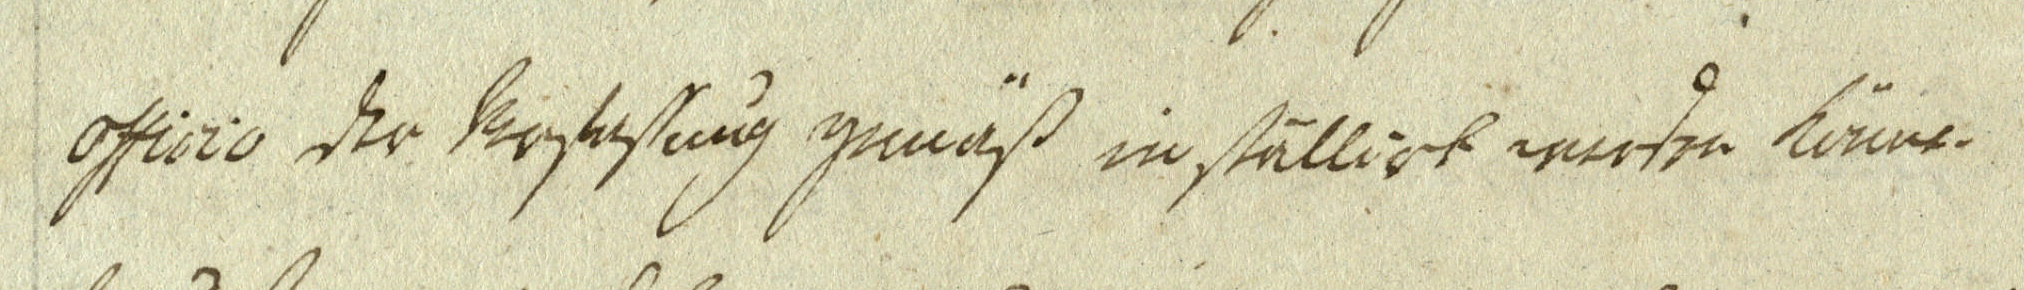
officio der Verfassung gemäß inställirt werden könne.
